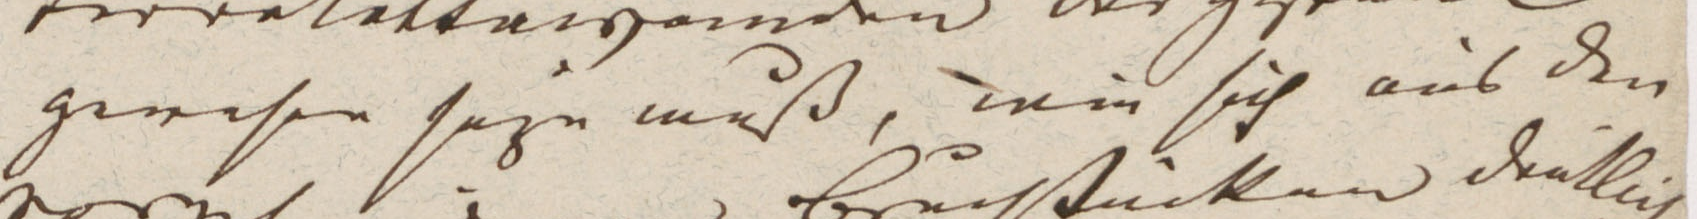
gewesen seyn muss, wie sich aus den
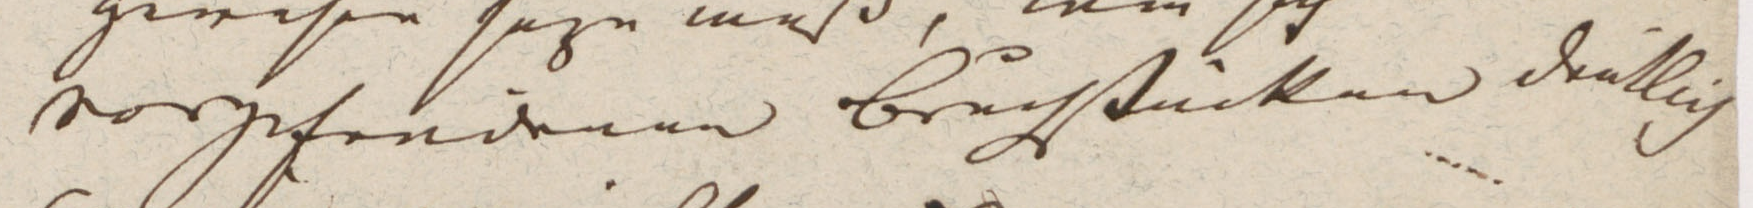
vorgefundenen Bruchstücken deutlich
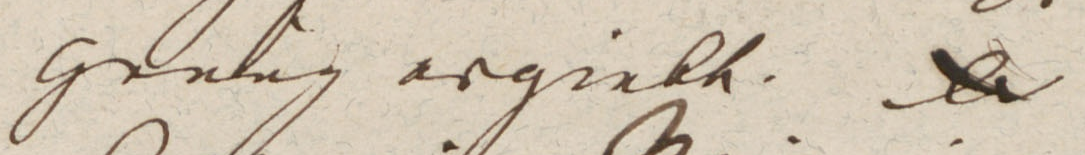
genug ergiebt. A
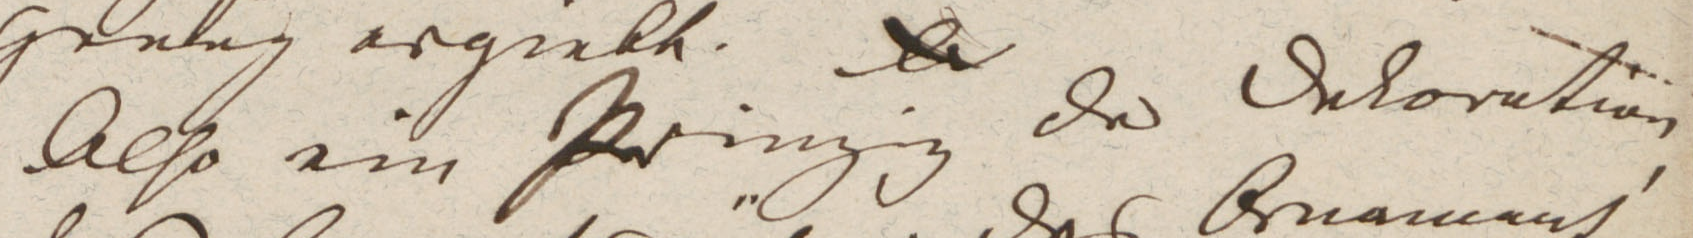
Also ein Prinzip der Dekoration
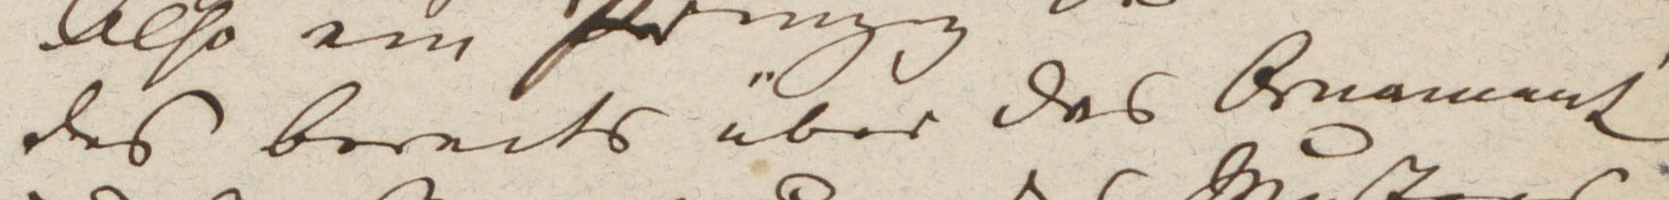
das bereits über das Ornament
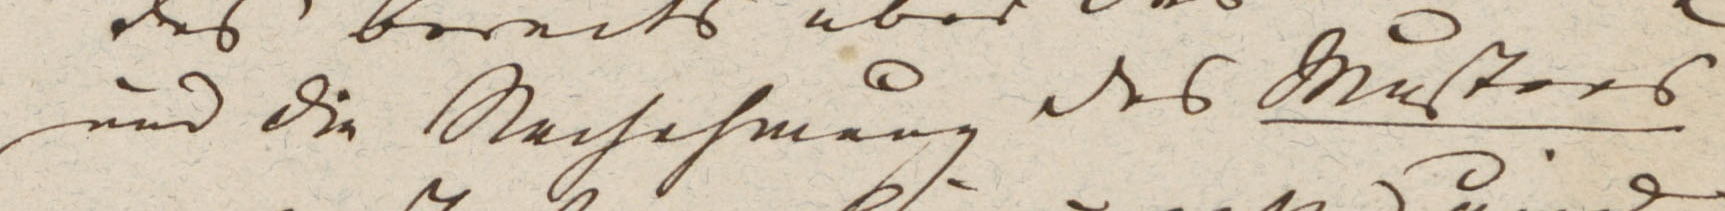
und die Nachahmung des Musters
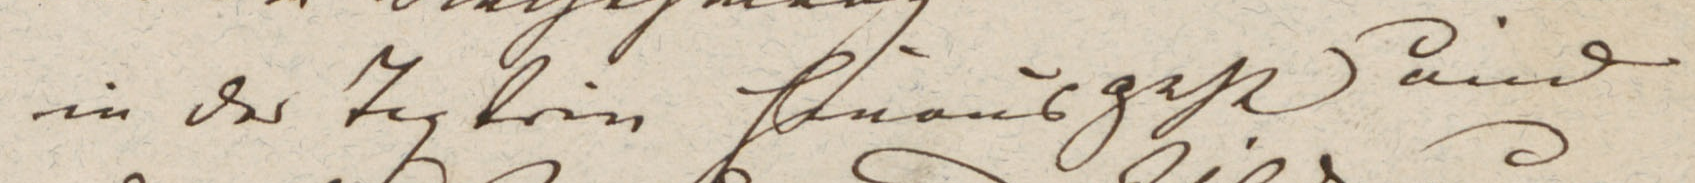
in der Textrin hinausgeht und
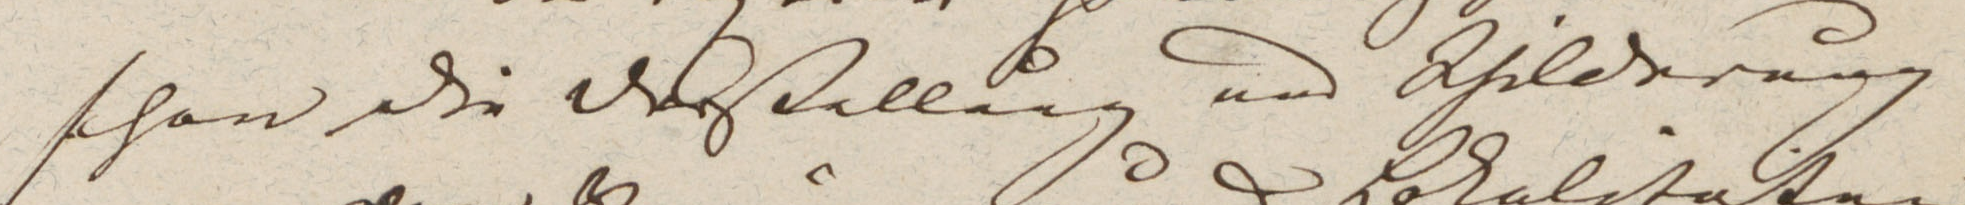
schon die Darstellung und Schilderung
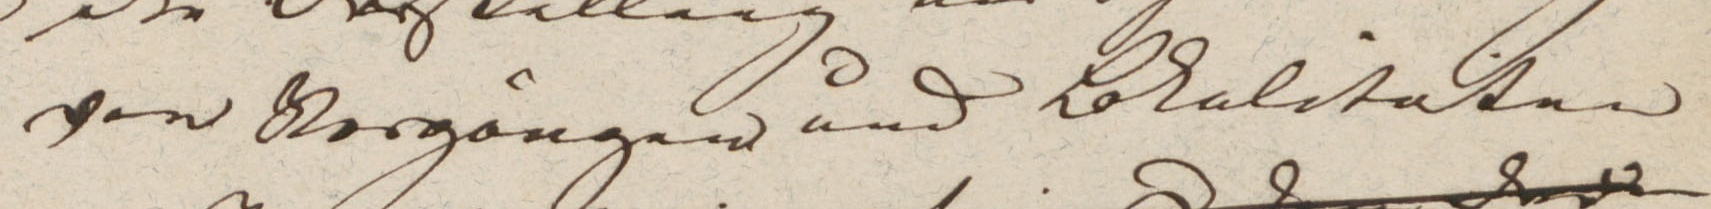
von Vorgängen und Lokalitäten
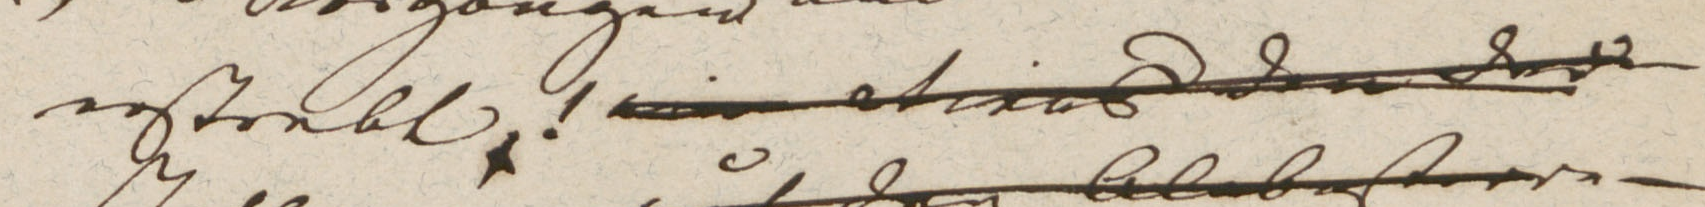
erstrebt,! ein etwas den der
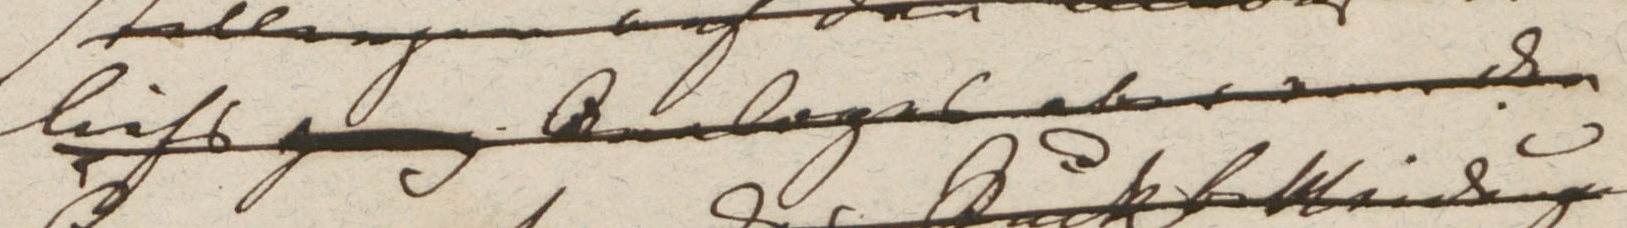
liefs ganz Analoges aber von den
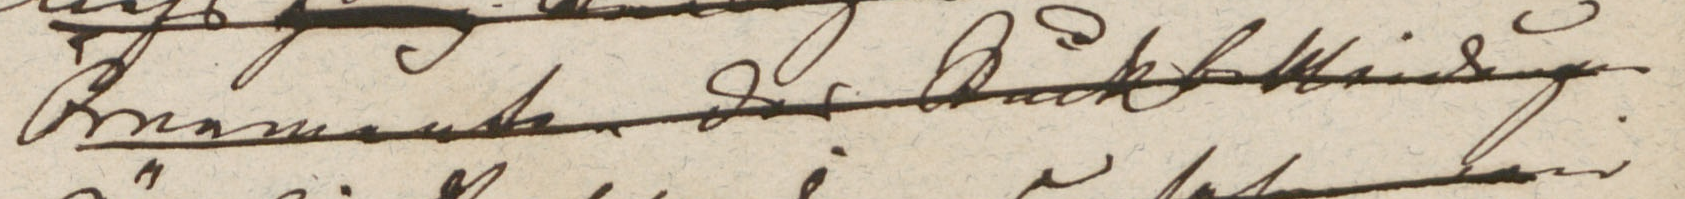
Ornamenten der Stuckbekleidungen
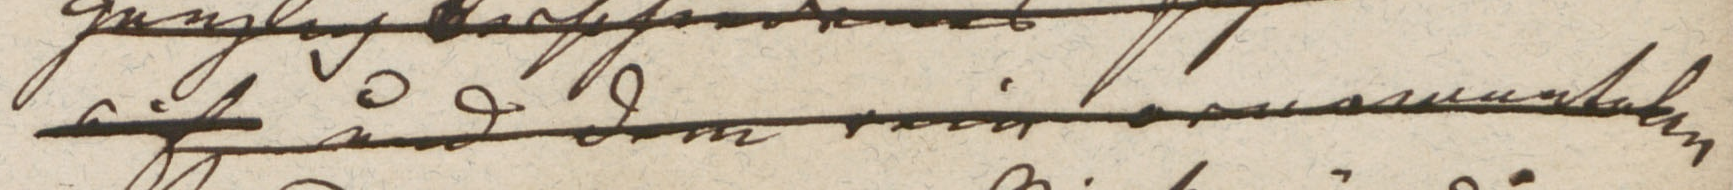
auf und dem rein ornamentalen
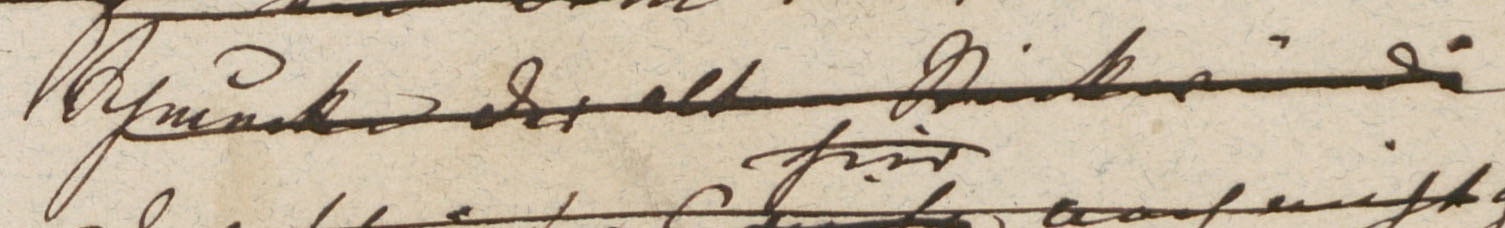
Schmucke der alten Stuckwände
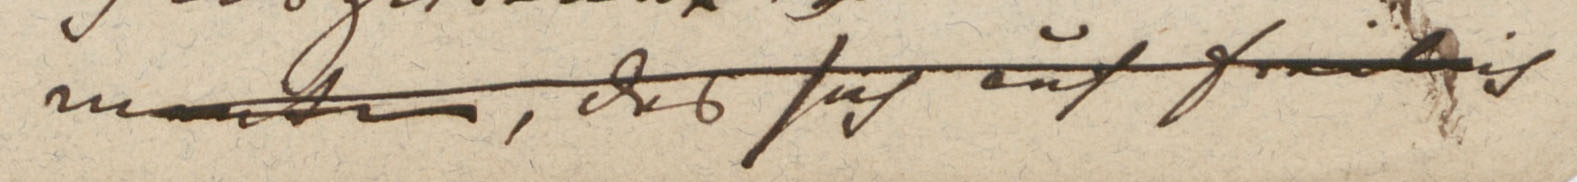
mente, das sich auf freilich
